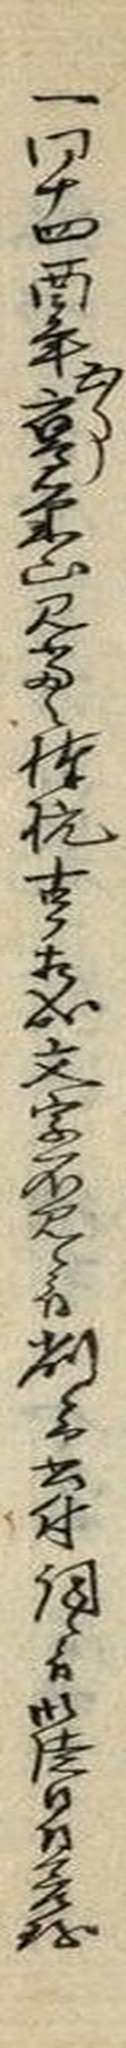一同十四酉年五月鷹巣山見当之棒杭古ク相成文字不見候ニ付削候而書付調候ニ付御徒目付差越
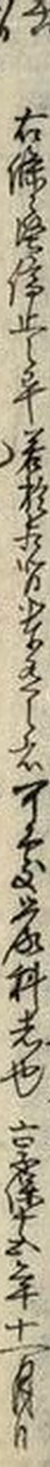右条々堅停止之事若於相背輩有之上ハ可処厳科者也享保十五年十一月日
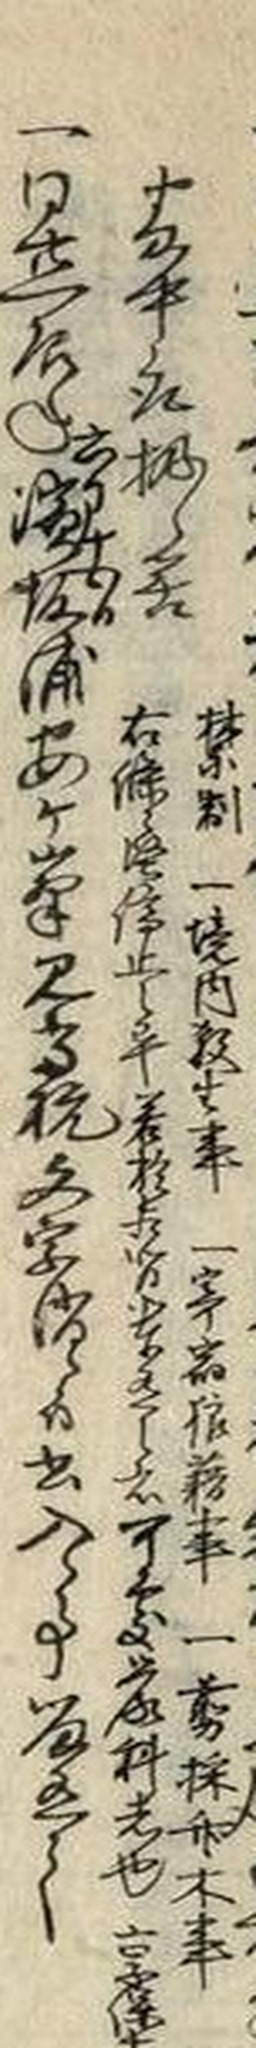一同廿一辰年六月十五日浜坂浦安ケ峰見当杭文字消候ニ付書入候事留有之
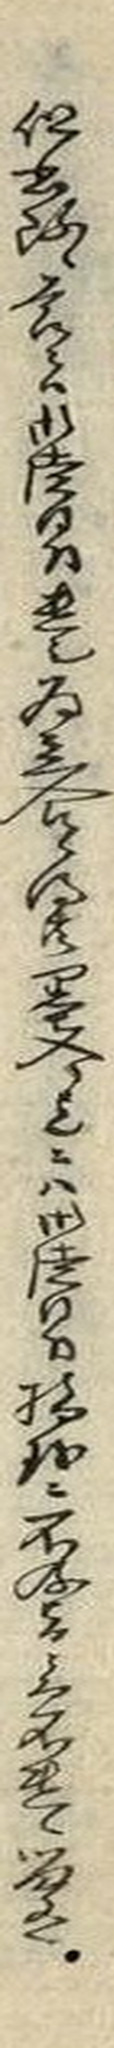但書致候節ニハ御徒目付遣シ為立合候得共墨入り迄ニハ御徒目付指越ニ不及旨ニ而不遣候留有
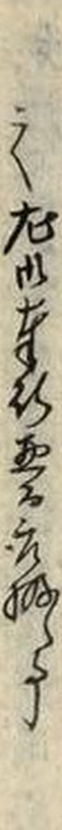之尤御奉行惣而取扱候事
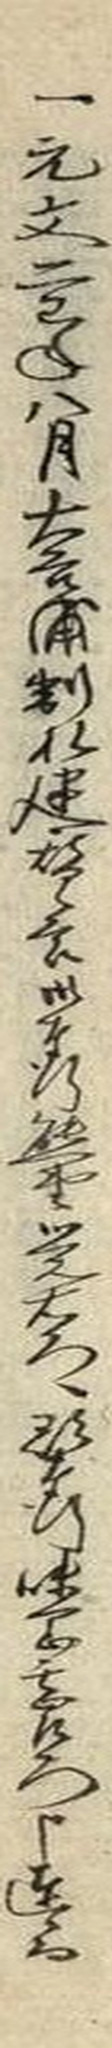一元文二丑年八月大谷浦制札建替之節御奉行熊野覚右衛門へ郡奉行味岡甚左衛門申達候而
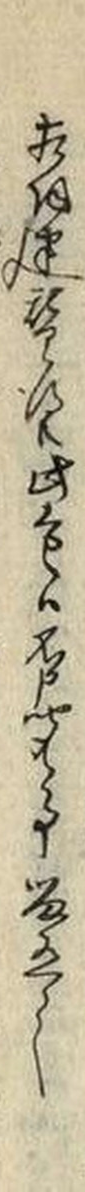相調建替候得共此方へハ不申聞候事留有之
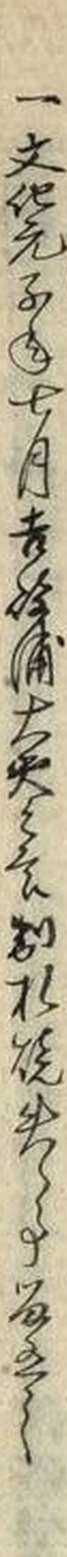一文化元子年七月吉崎浦大火之節制札焼失之事留有之
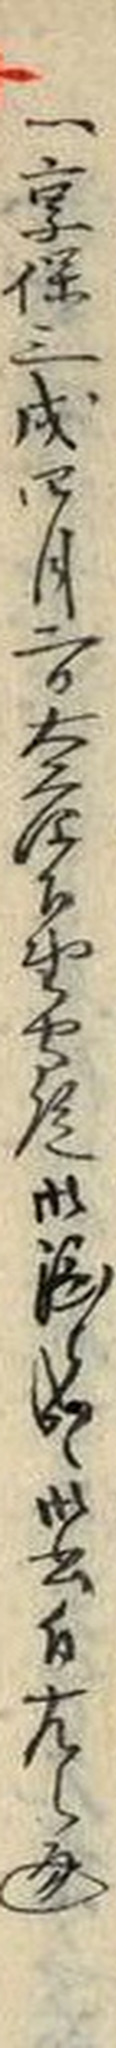一享保三戌四月二日大久保下野守殿御渡被成候御書付左之通

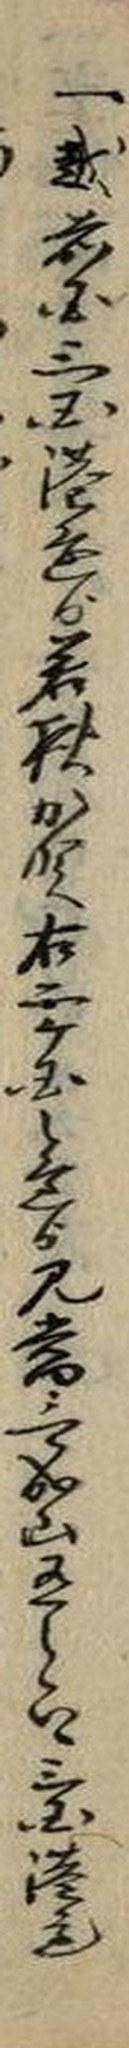一越前国三国港辺ゟ若狭加賀右二ケ国之辺ゟ見当ニ可成山有之候ハヽ三国港辺
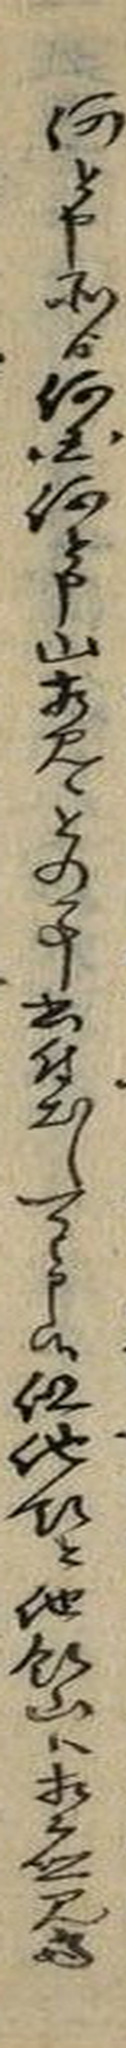何と申所ゟ何国何と申山相見候との事書付出し可被申候但他領と他領山ハ相応見当
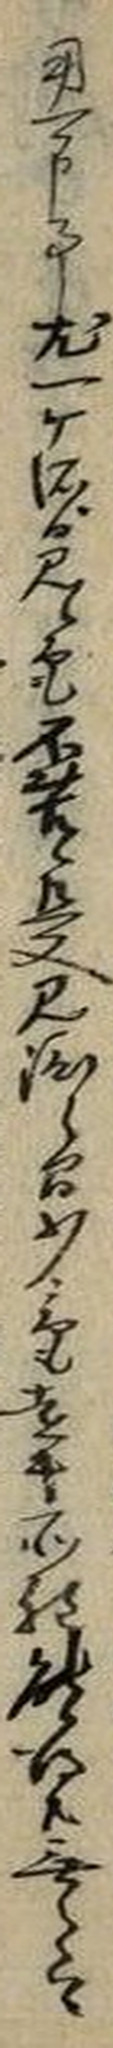用可申事尤一ケ所ゟ見候而も不苦候且又見渡候間少ニ而も遠キ所程能候得共無之候ハヽ
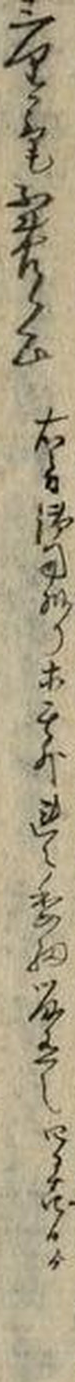二三里ニ而も不苦候已上右ニ付御用掛り等其外連々委細留有之四月十四日ゟ
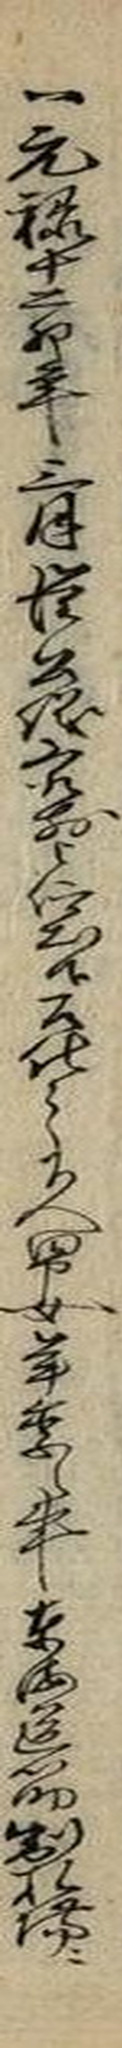一元禄十二卯年三月従公儀最前被仰出候召仕之下人男女年季之事東海道筋制札場ニ
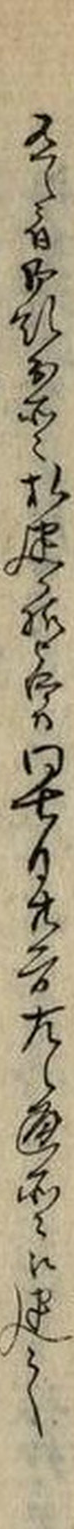有之ニ付御領分所々札建候様被仰付同七月廿二日左之通所々江建之
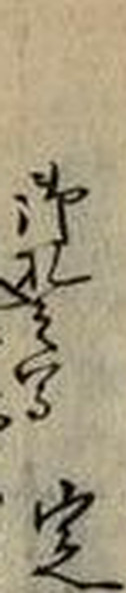御札之写
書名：御国他国諸事之部
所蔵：福井県文書館 Fukui Prefectural Archives
